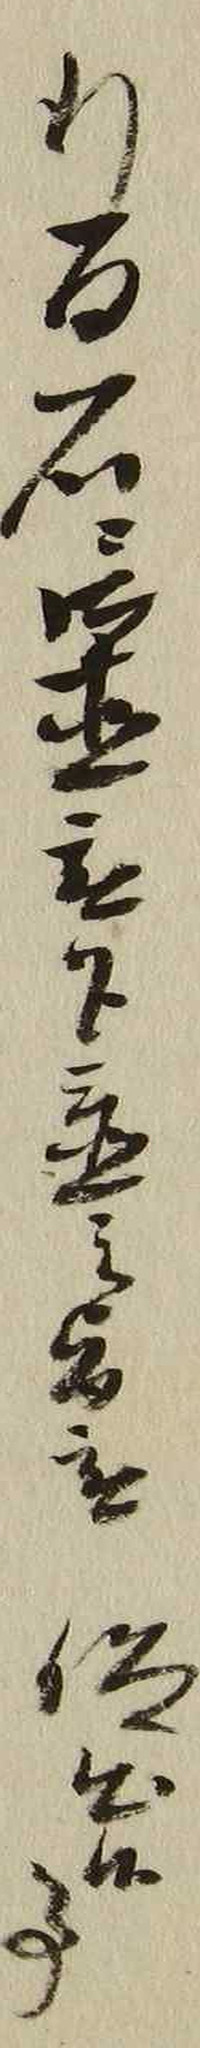行百石ニ御直被下置之旨被仰出候事
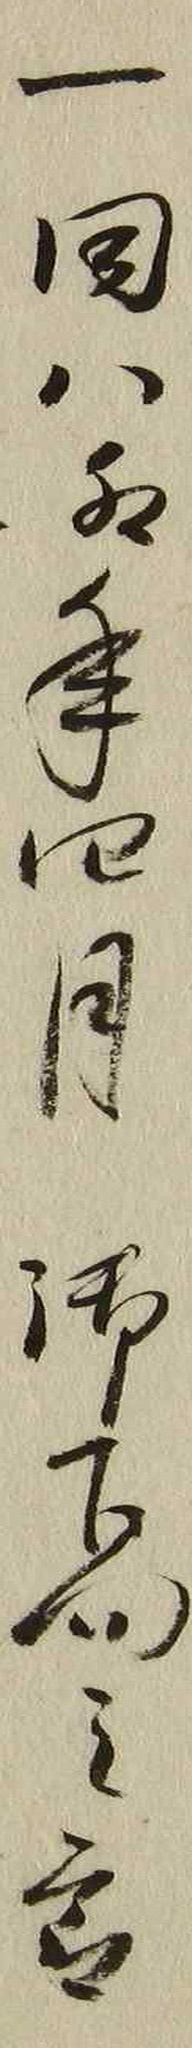一同八卯年四月御下向之節
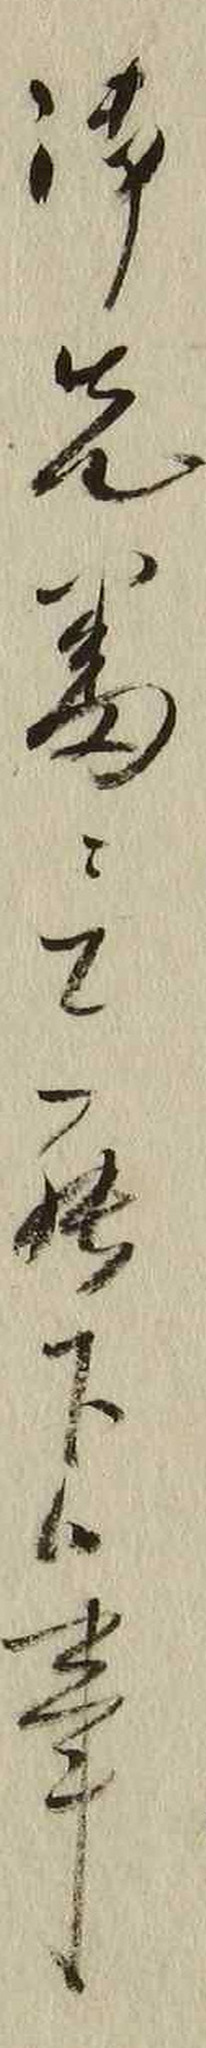御先番ニて罷下候事
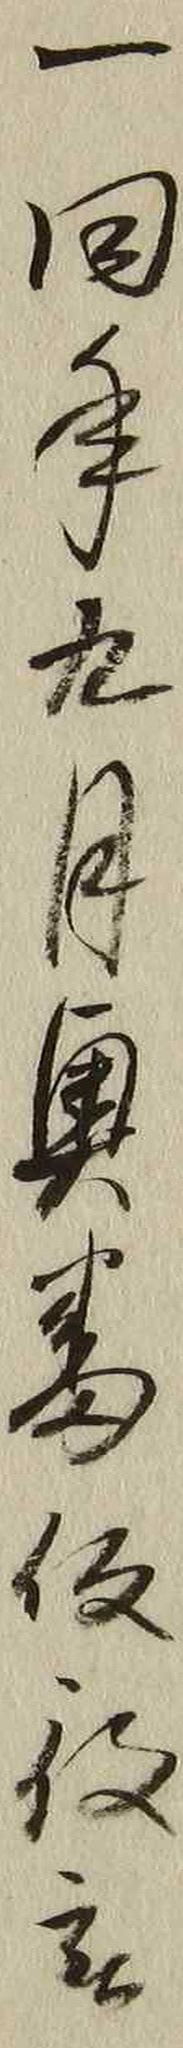一同年九月奥番仮役被
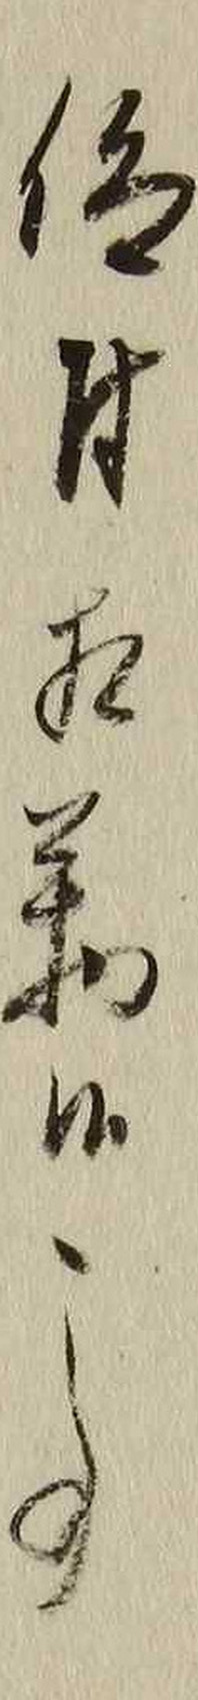仰付相勤候事
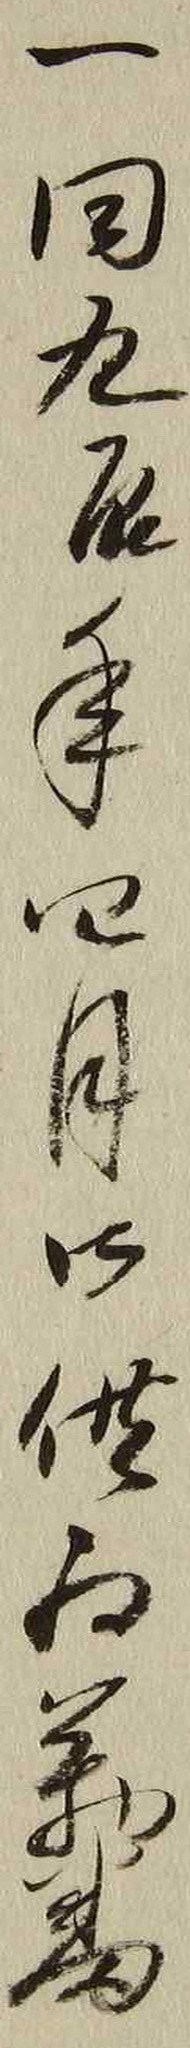一同九辰年四月御供為勤番
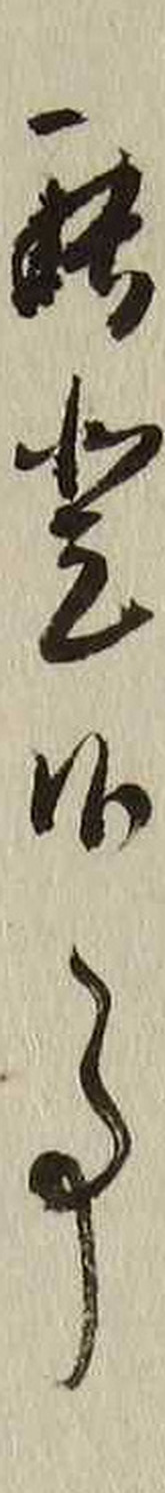罷登候御
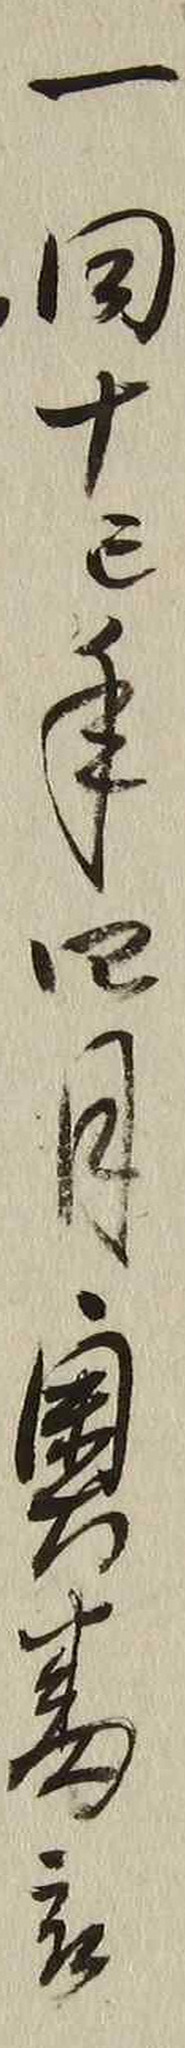一同十巳年四月奥番被
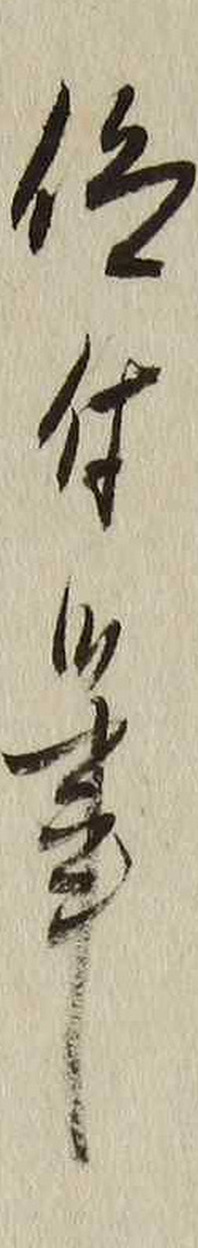仰付候事
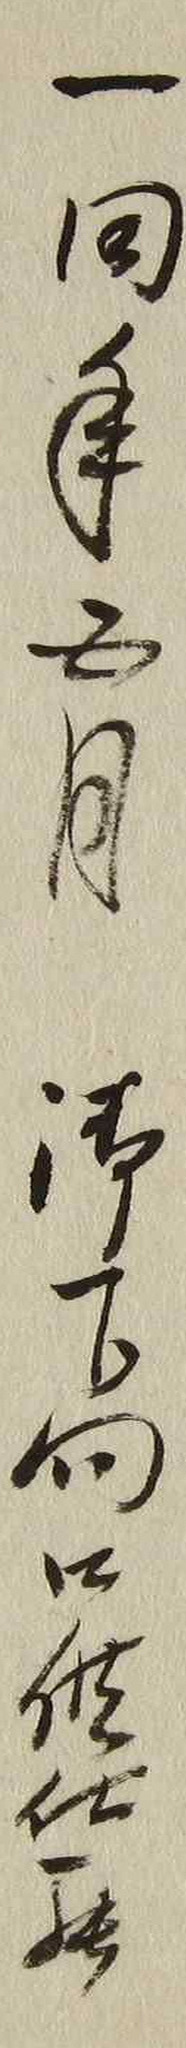一同年五月御下向御供仕罷
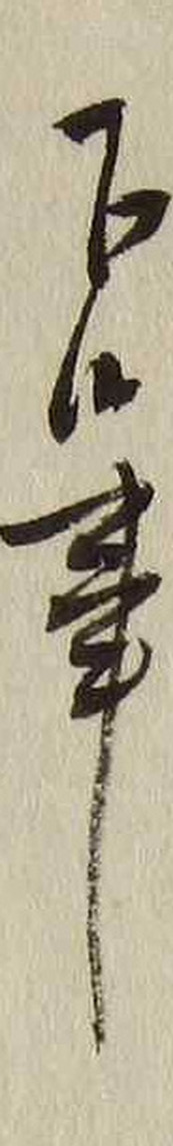下候事
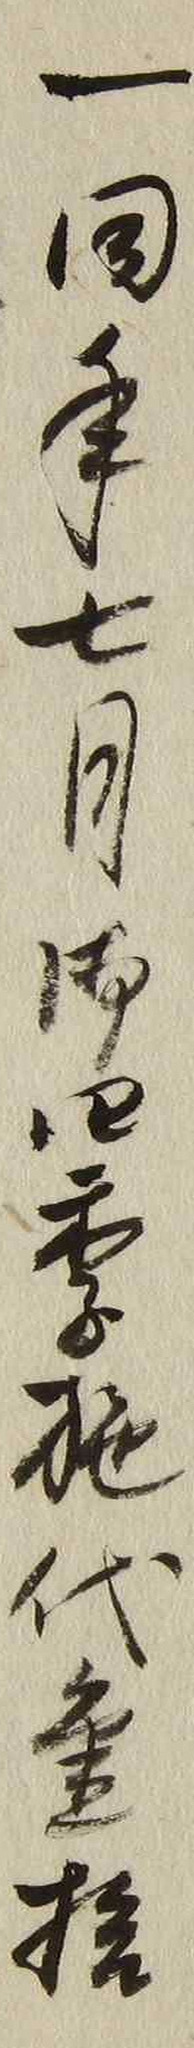一同年七月御四季施代金拾
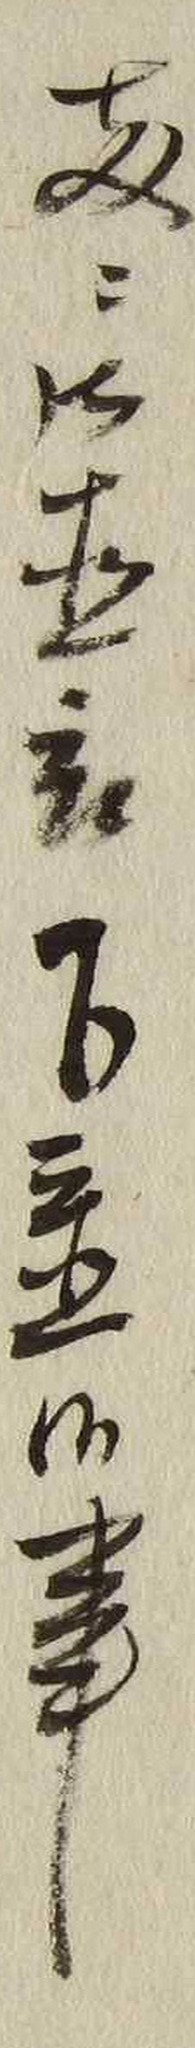両ニ御直被下置候事
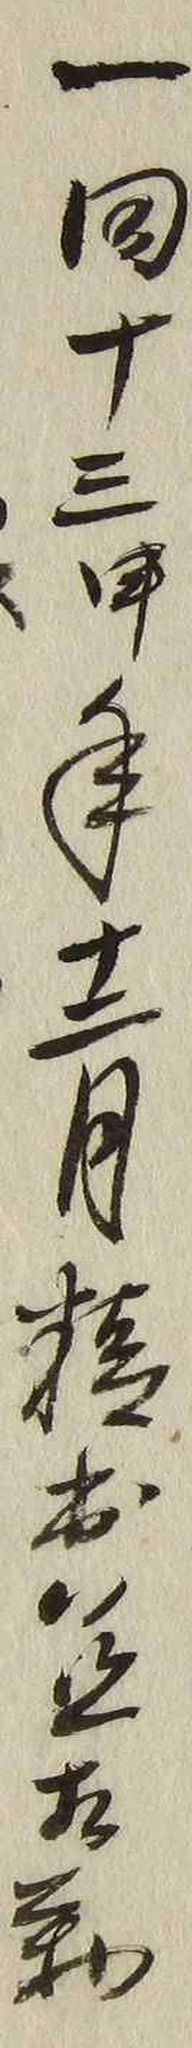一同十三申年十二月精出宜相勤
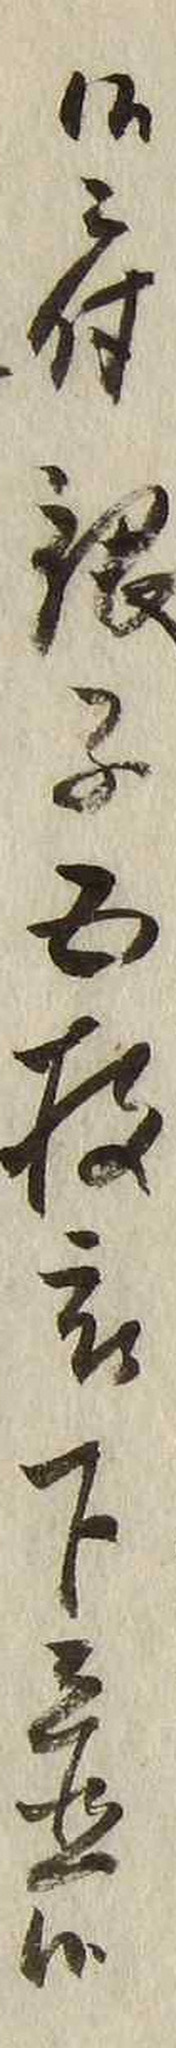候ニ付銀子五枚被下置候
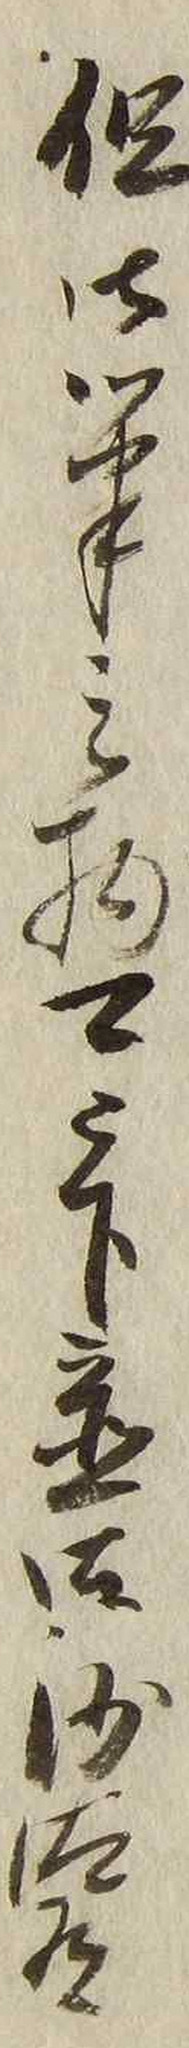但御筆之物可被下被置召沙汰有
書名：諸士系譜　巻之355　す之部5
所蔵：会津若松市立会津図書館
